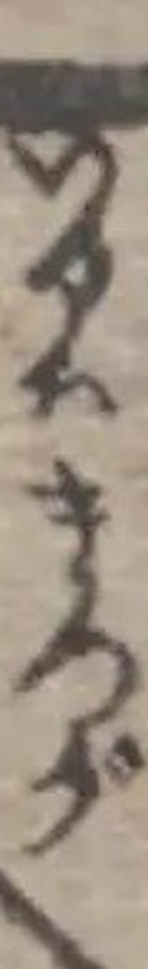いるはまつが
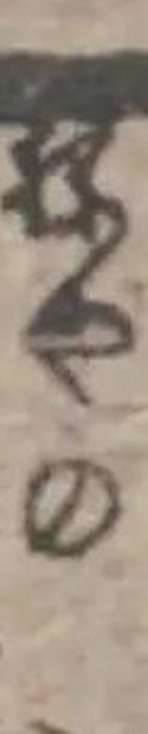ねやの
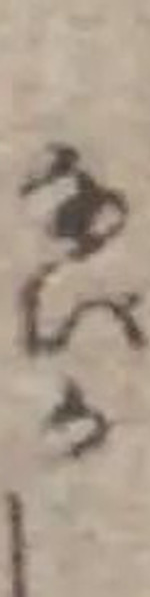ないか
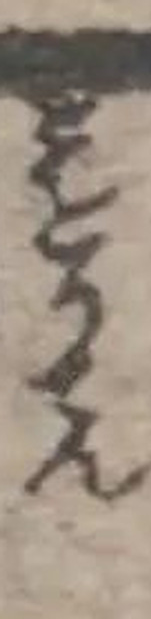とをりてん
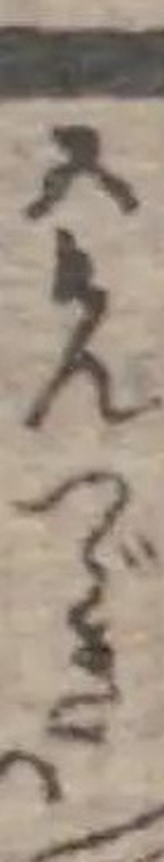五けんつゞきは
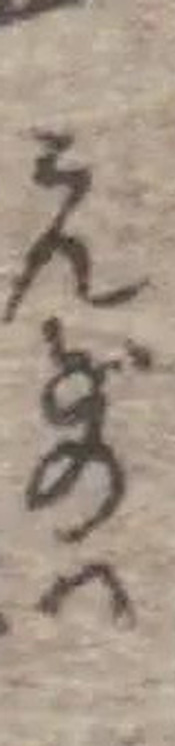こんどのは
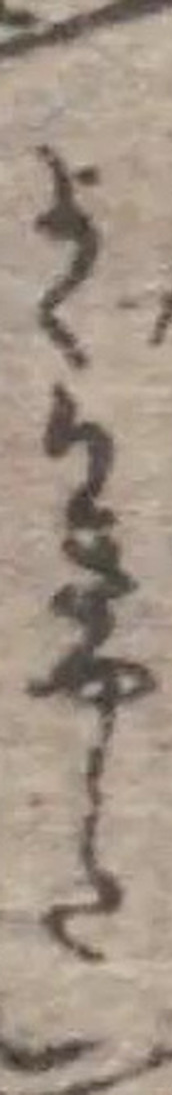よくかきやした
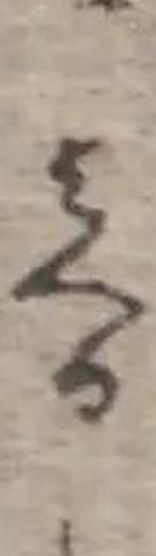みへる
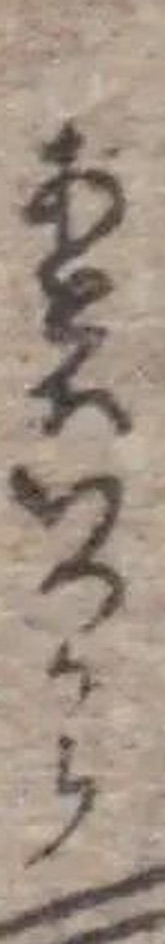あとはいつから
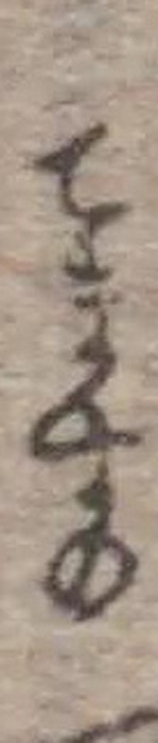てますの

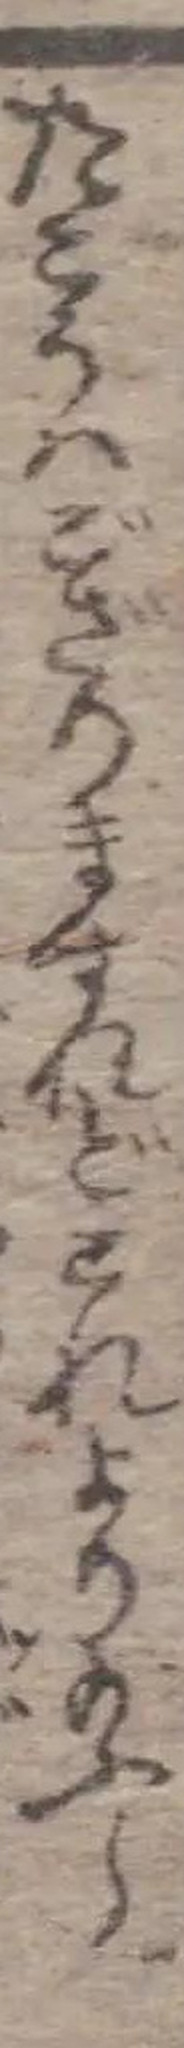たこうはござりますれどこれよりもふし
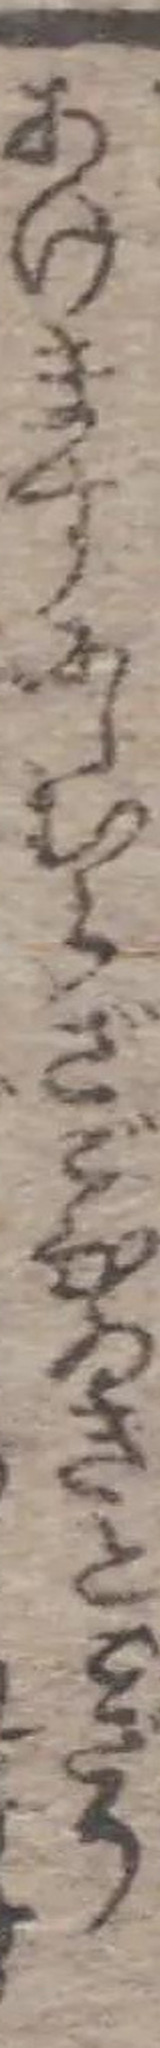あけますにしむらざごひゐきとござり
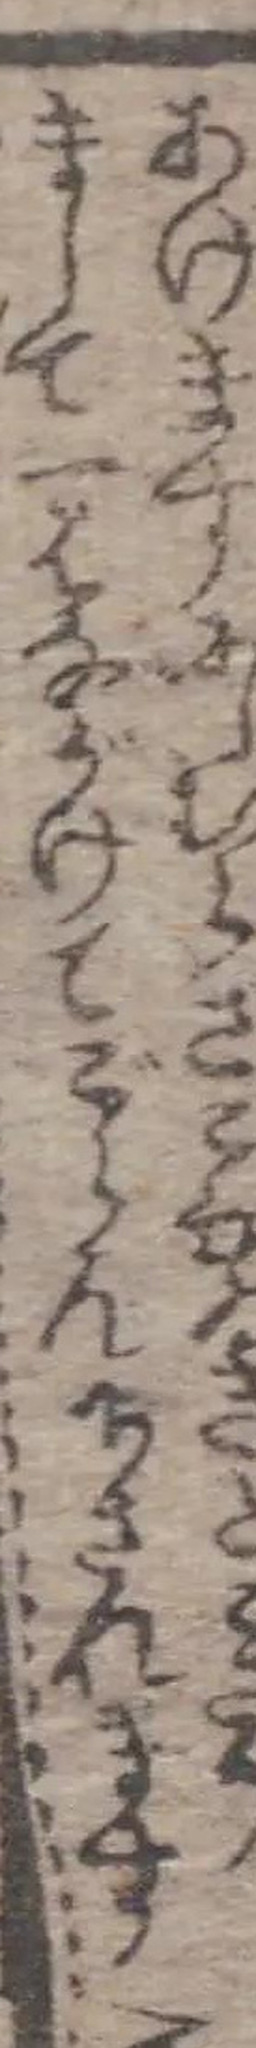まして一はながけてごらん下されます
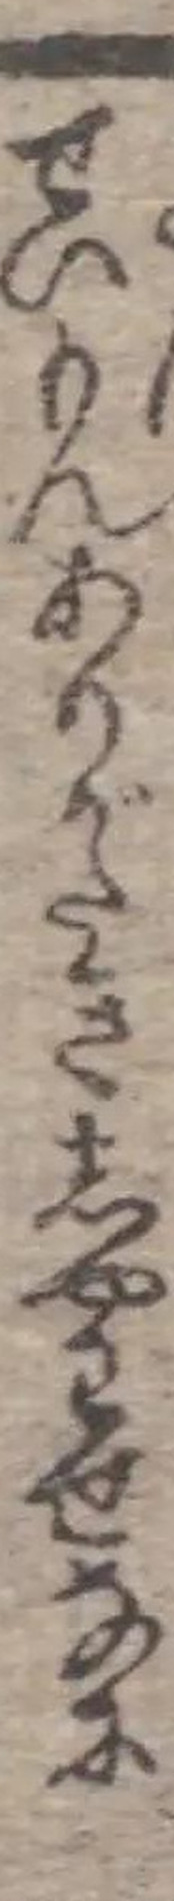せいもんありがたきしやわせなに
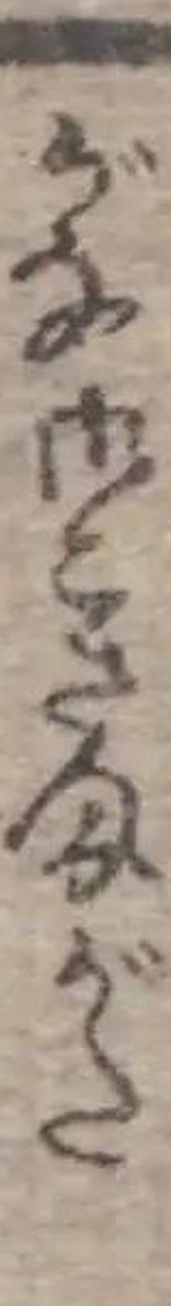がな御こさまがた
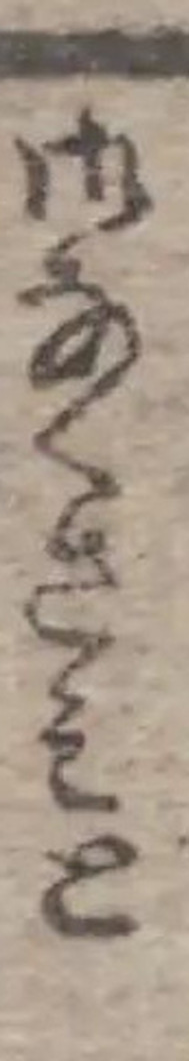御なくさみと
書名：富多高慢噺 3巻
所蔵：国立国会図書館 National Diet Library, JAPAN
